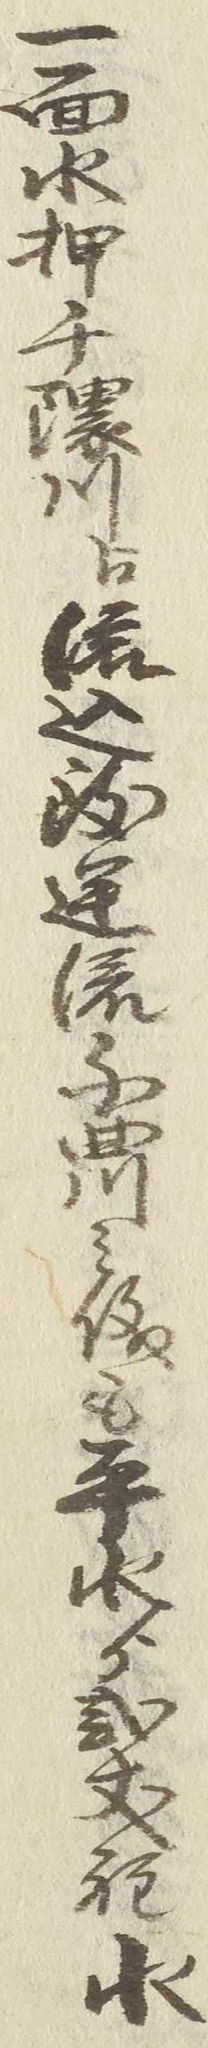一面水押千隈川江流込致運流千曲川之儀も平水ゟ弐丈程水
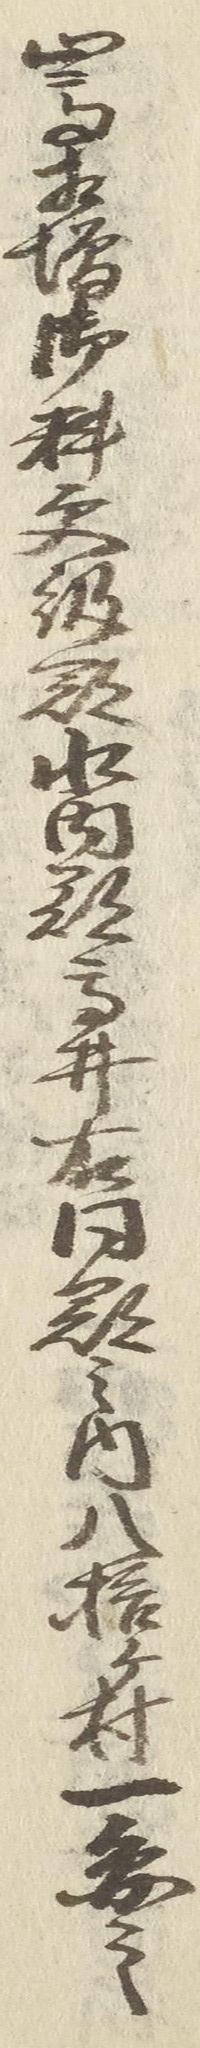嵩相増御料更級郡水内郡高井右同郡之内八拾ヶ村一円之
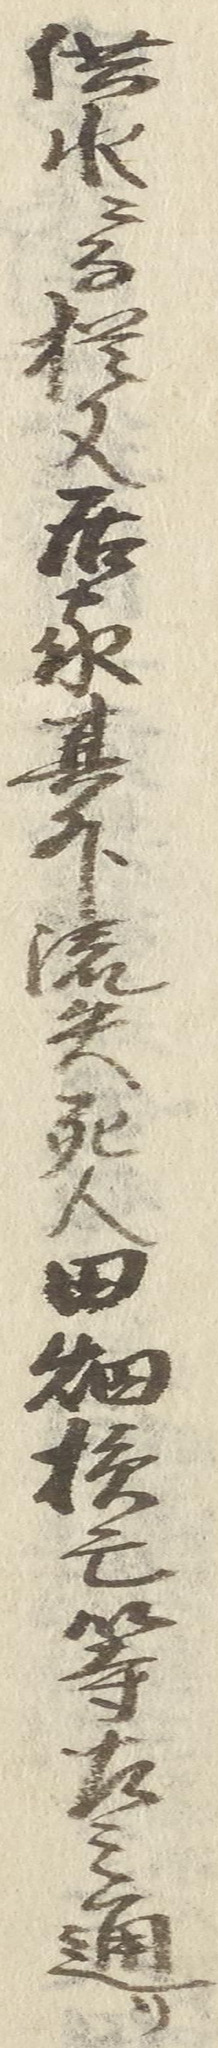洪水ニ而猶又居家其外流失死人田畑損亡等左之通り

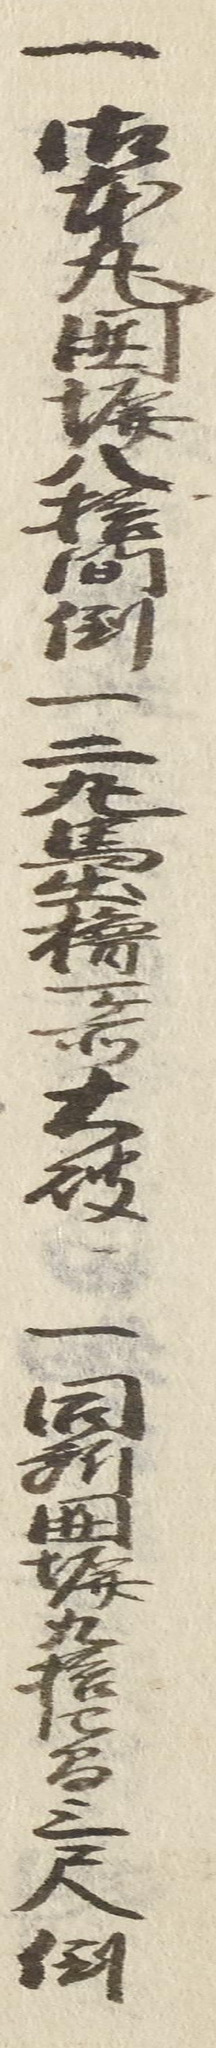一御本丸囲塀八十間倒一二丸馬出櫓一一ヶ所大破一同所囲塀九拾四間三尺倒
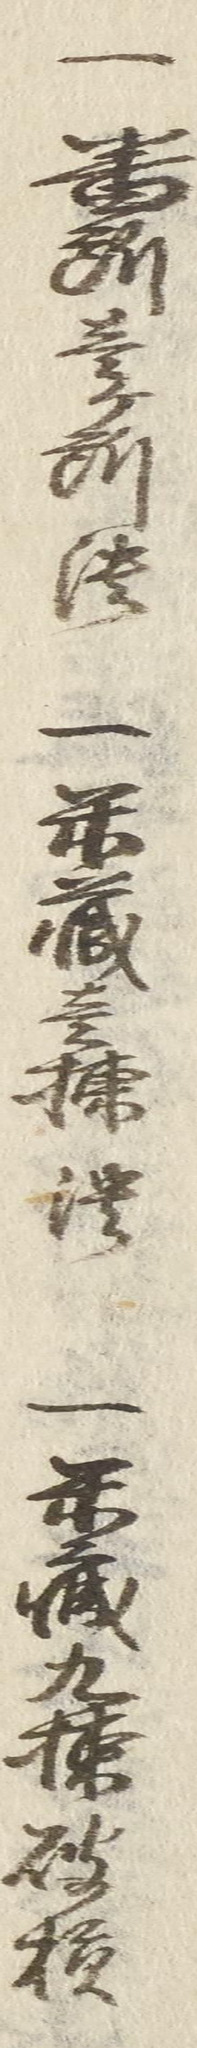一番所壱ヶ所潰れ一米蔵壱棟潰一米蔵九棟破損
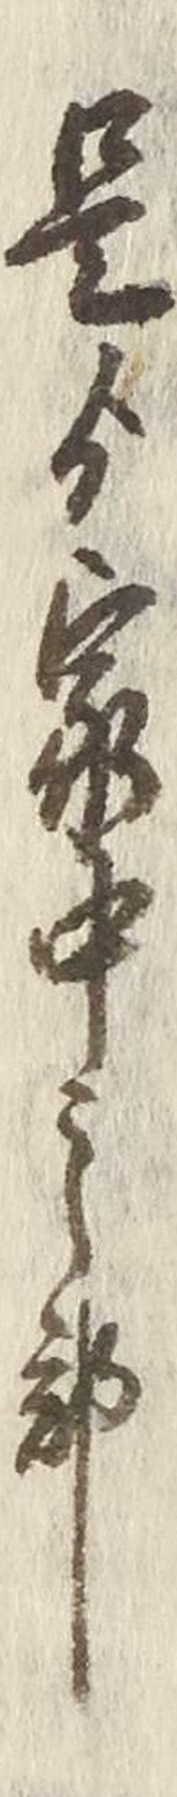是ゟ家中之部
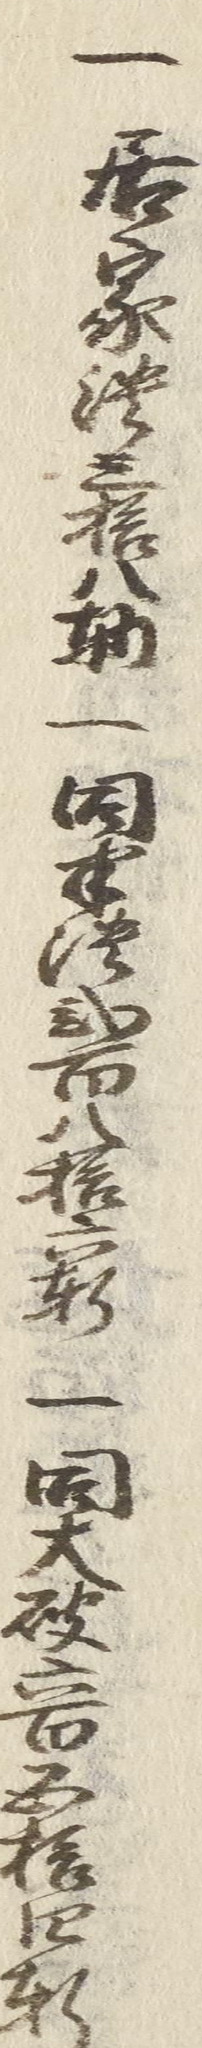一居家潰三拾八軒一同半潰弐百八拾六軒一同大破六百五拾四軒
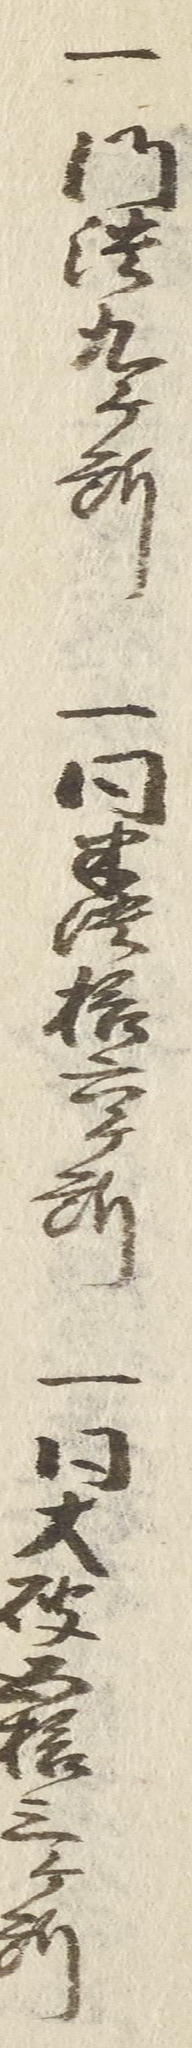一門潰九ヶ所一同半潰拾六ヶ所一同大破五拾三ヶ所
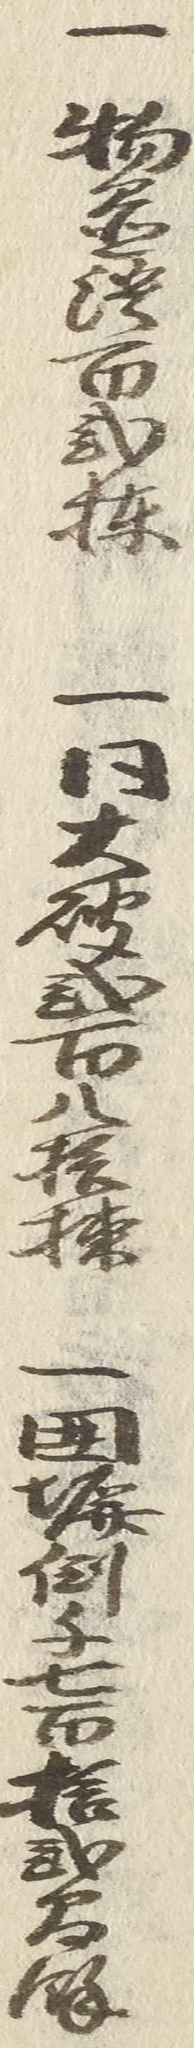一物置潰れ百弐棟一同大破弐百八拾棟一囲塀倒千七百拾弐餘
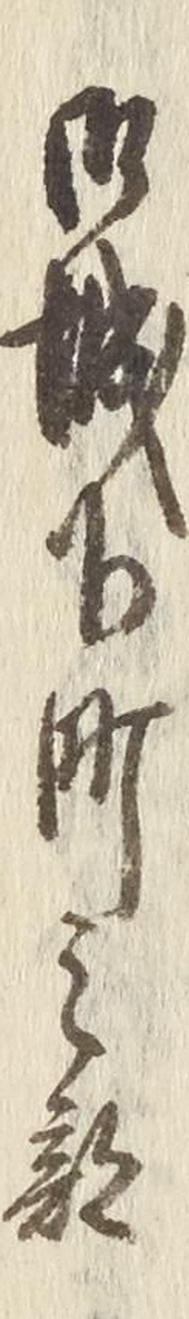御城下町之部
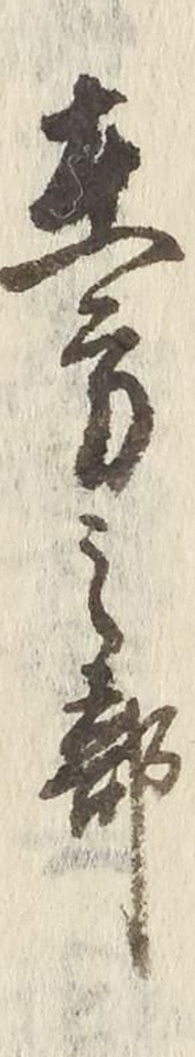在方之部
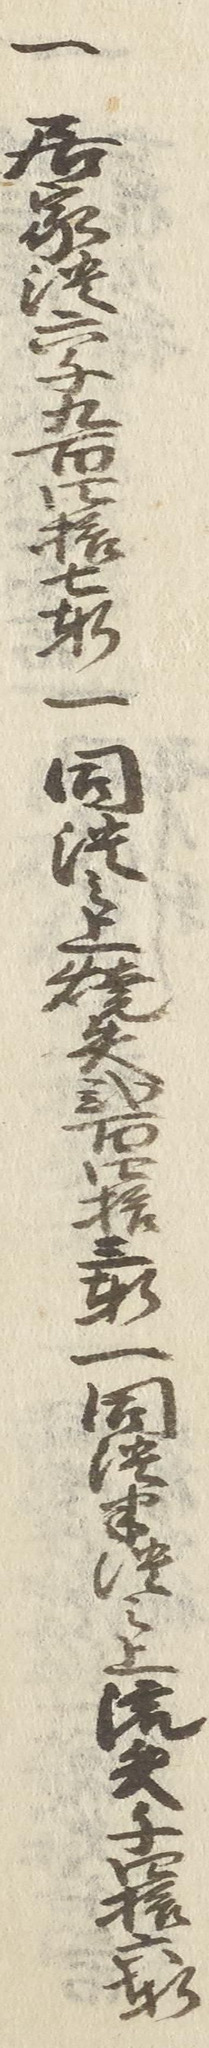一居家潰六千九百四拾七軒一同潰之上焼失弐百四拾三軒一同半潰之上流失千四拾六軒

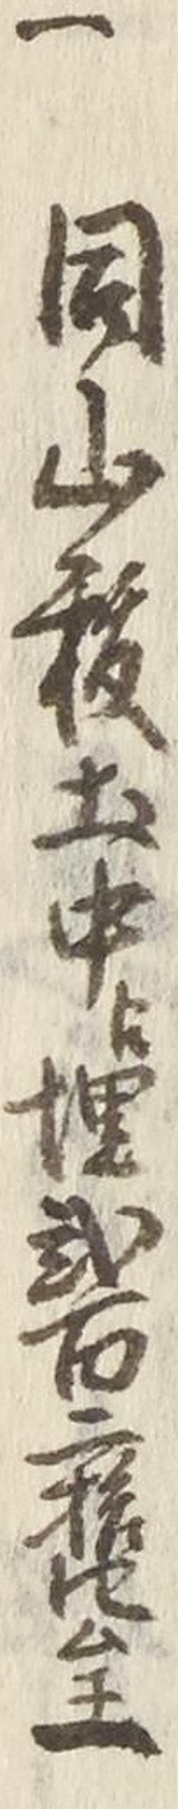一同山抜土中江埋弐百二拾四ム子
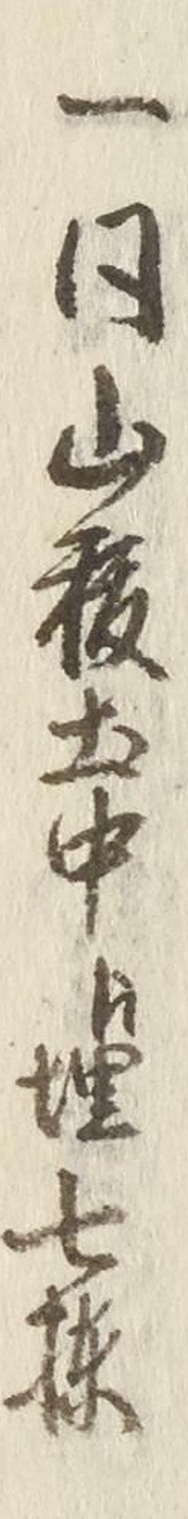一同山抜抜土中江埋七棟
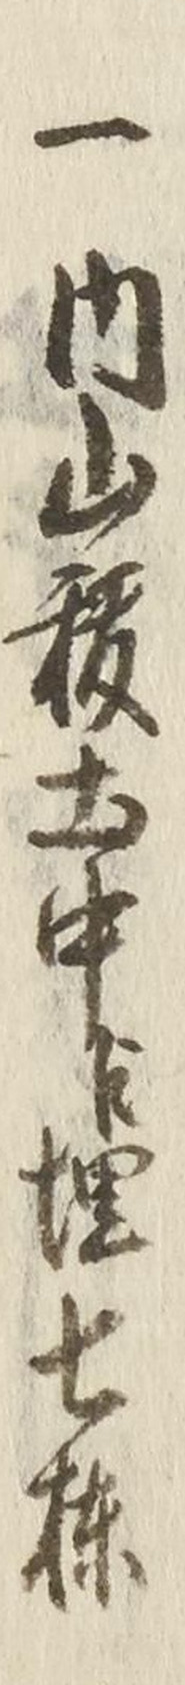一同山抜抜土中江埋七棟
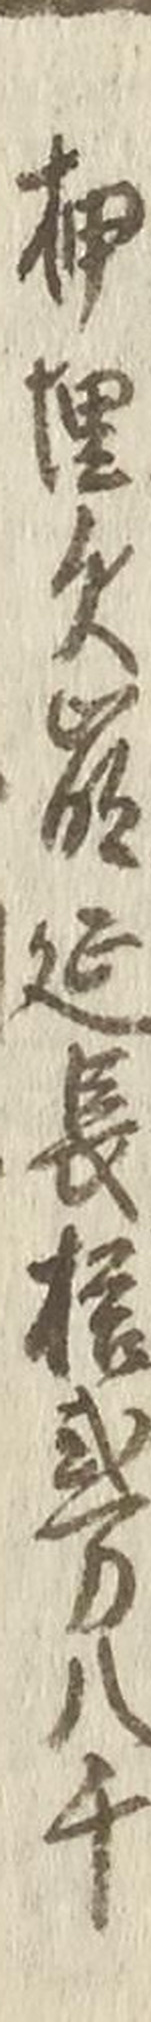押埋欠崩延長拾弐万八千
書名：従往古地震御届書記誌之一
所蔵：東京大学地震研究所図書室 Earthquake Research Institute Library, The University of Tokyo, JAPAN
